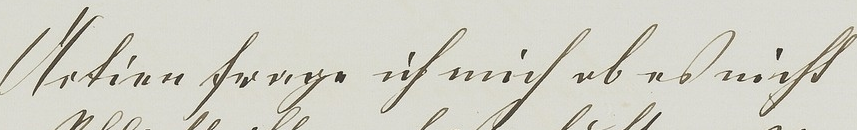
Actien frage ich mich ob es nicht
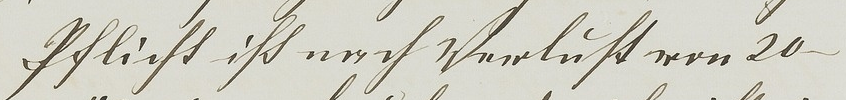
Pflicht ist nach Verlust von 20–
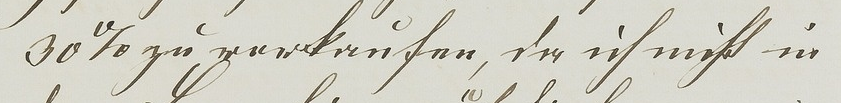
30% zu verkaufen, da ich nicht in
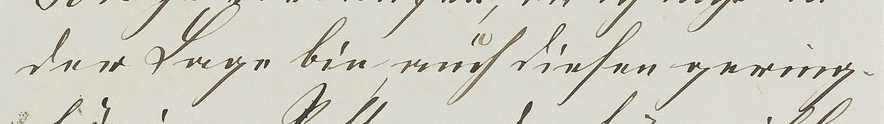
der Lage bin, auch diesen gering-
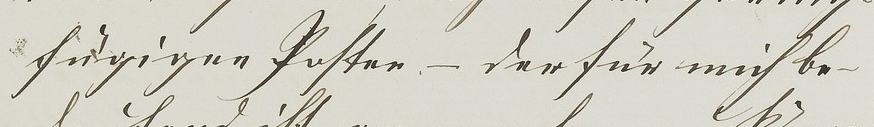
fügigen Posten – der für mich be-
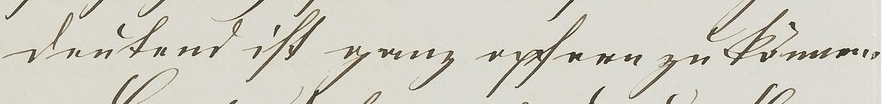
deutend ist ganz opfern zu können.
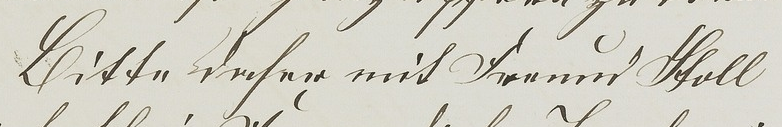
Bitte daher mit Freund Stoll
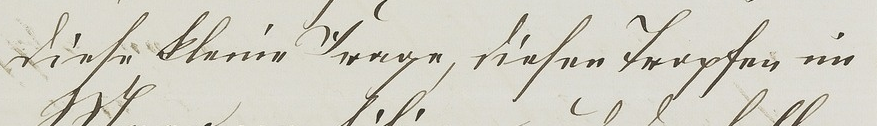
diese kleine Frage, diesen Tropfen im
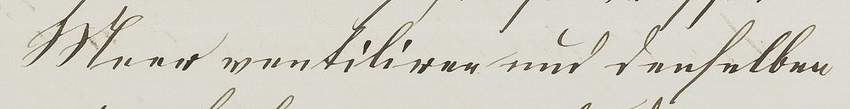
Meer ventiliren und denselben
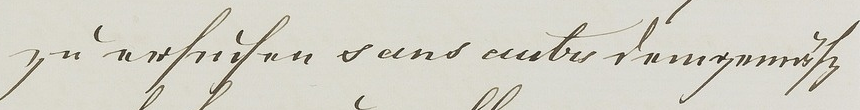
zu ersuchen sans autre demgemäsz
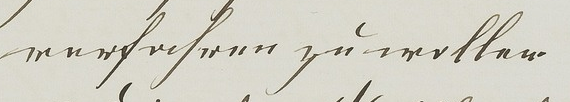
verfahren zu wollen.
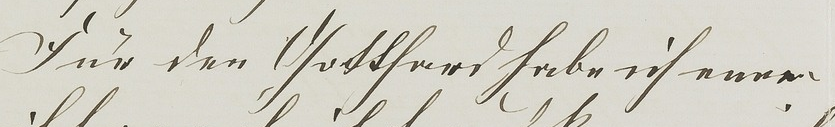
Für den Gotthard habe ich ener-
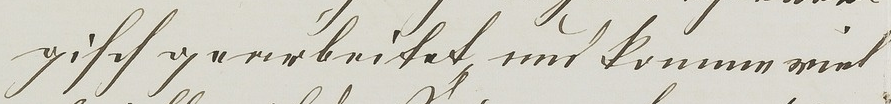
gisch gearbeitet und komme viel-
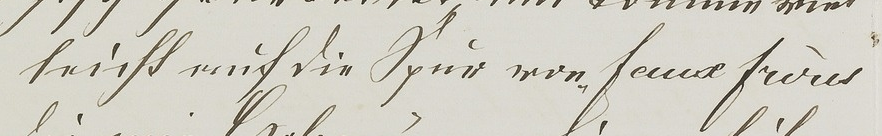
leicht auf die Spur von «faux frères»
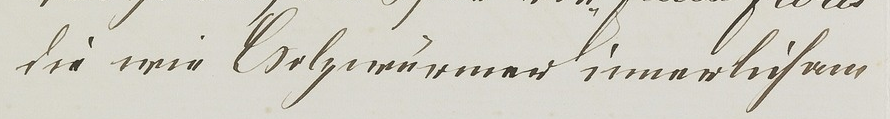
die wie Holzwürmer innerlich am
